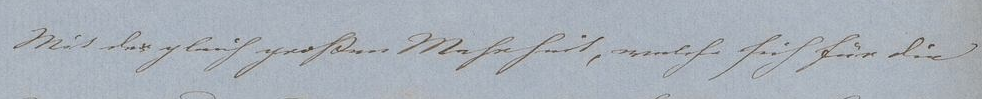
Mit der gleich großen Mehrheit, welche sich für die
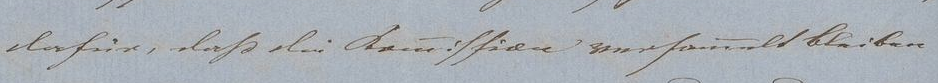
dafür, daß die Kommission versammelt bleiben
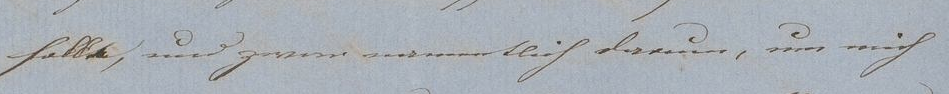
sollte, und zwar namentlich darum, um mich
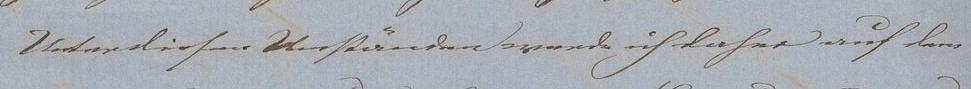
Unter diesen Umständen werde ich daher auf dem
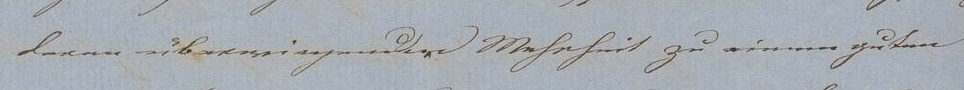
deren überwiegender Mehrheit zu einem guten
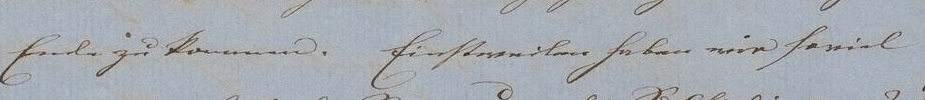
Ende zu kommen. Einstweilen haben wir soviel
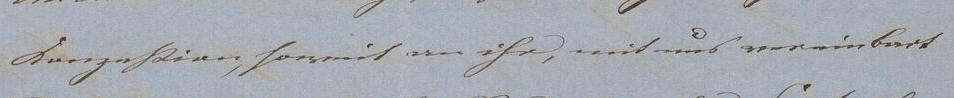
Konzeßion, soweit an ihr, mit uns vereinbart
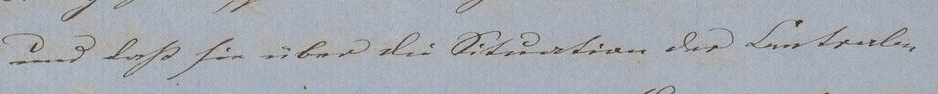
und daß sie über die Situation der Central-
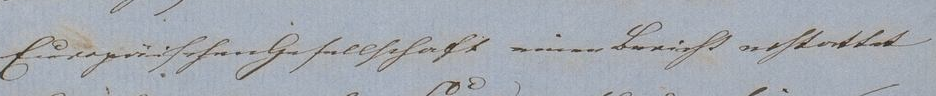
Europäischen Gesellschaft einen Bericht erstattet
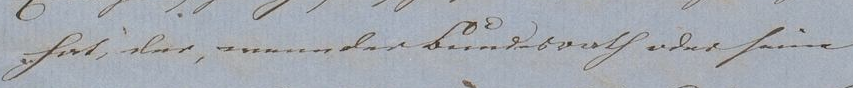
hat, der, wenn der Bundesrath oder seine
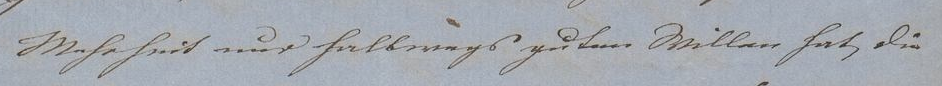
Mehrheit nur halbwegs guten Willen hat, die
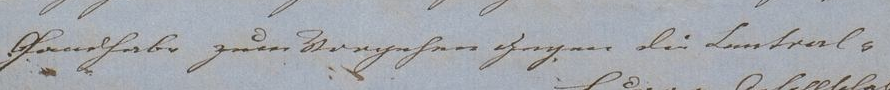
Handhabe zum Vorgehen gegen die Central-
